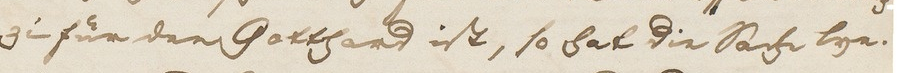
zi für den Gotthard ist, so hat die Sache we-
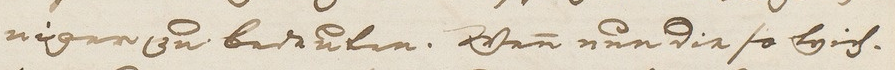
niger zu bedeuten. Wenn nun die so wich-
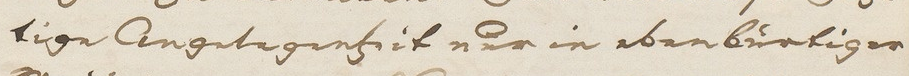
tige Angelegenheit nur in ebenbürtiger
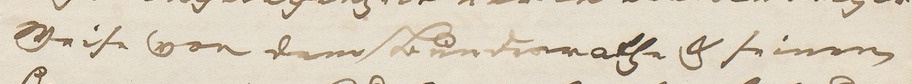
Weise von dem Bundesrathe & seinen
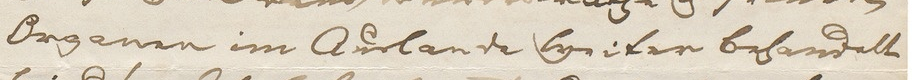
Organen im Auslande weiter behandelt
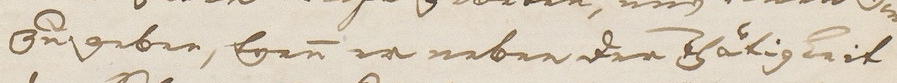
zu geben, wenn er neben der Thätigkeit
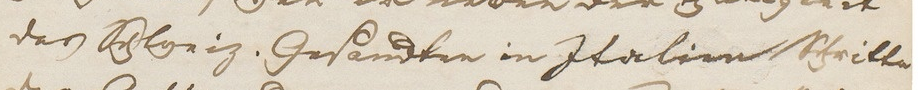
des Schweiz. Gesandten in Italien Schritte
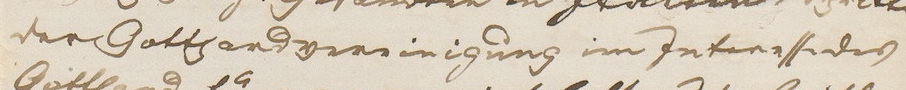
der Gotthardvereinigung im Interesse des
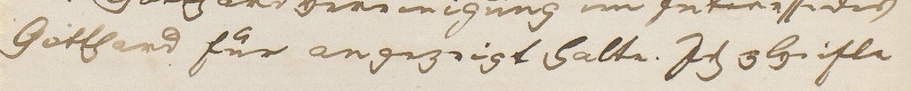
Gotthard für angezeigt halte. Ich zweifle
